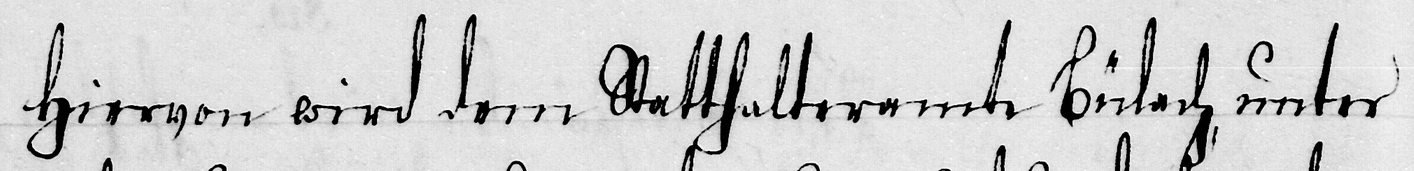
Hiervon wird dem Statthalteramte Bülach, unter
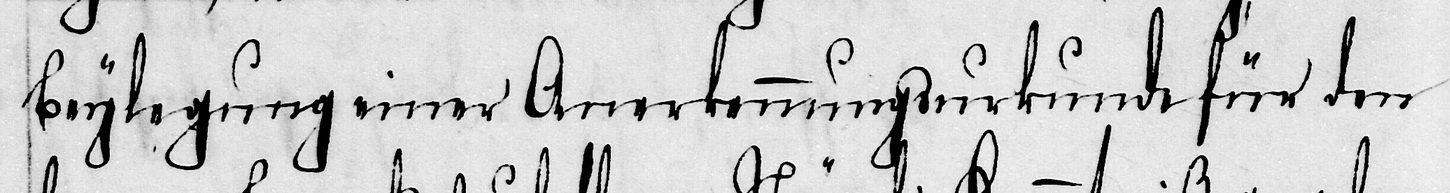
Beylegung einer Anerkennungsurkunde für den
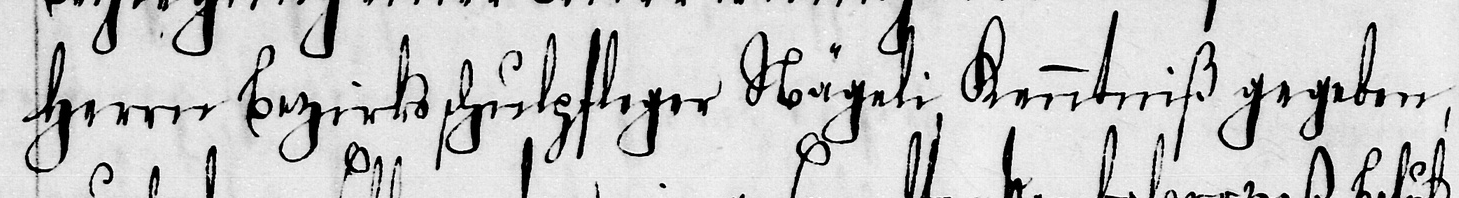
Herrn Bezirksschulpfleger Nägeli Kenntniß gegeben,
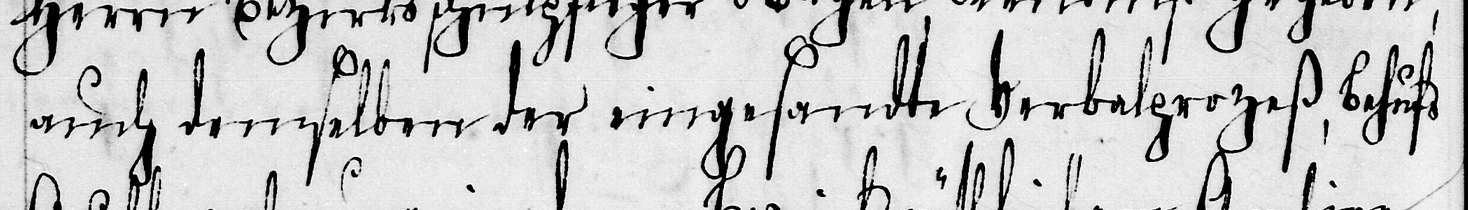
auch demselben der eingesandte Verbalprozeß, Behufs
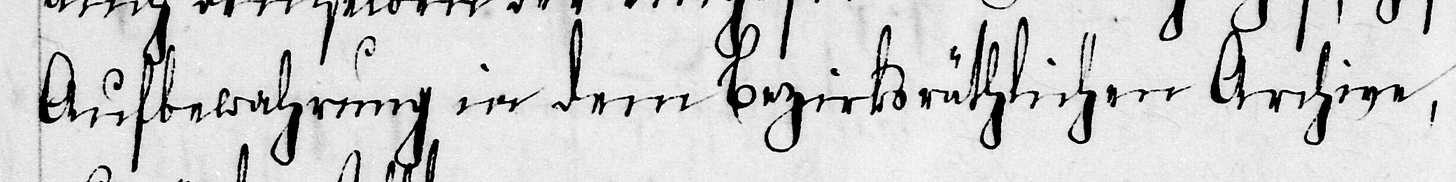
Aufbewahrung in dem Bezirksräthlichen Archive,
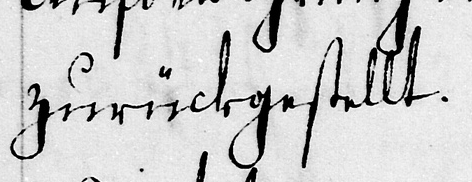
zurückgestellt.
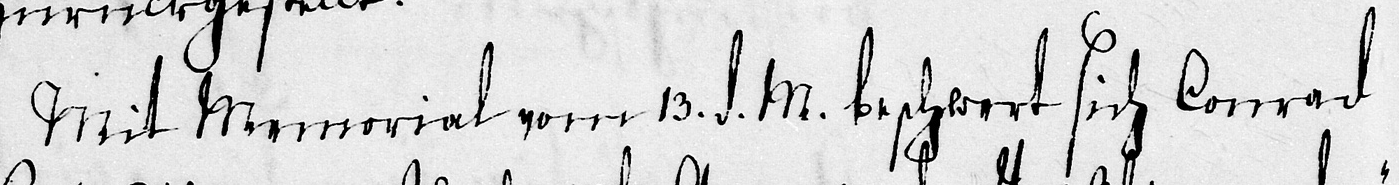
Mit Memorial vom 13. d. M. beschwert sich Conrad
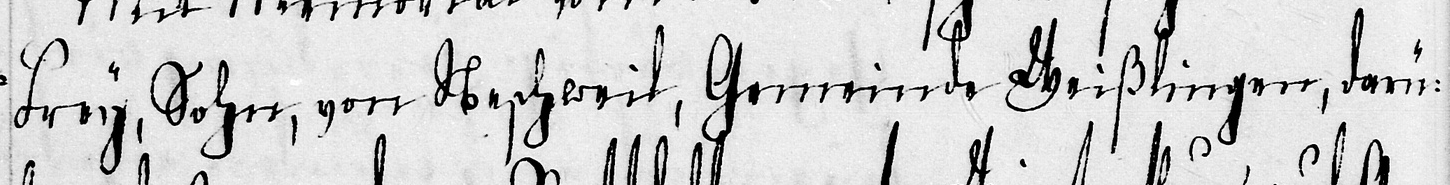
Frey, Sohn, von Neschweil, Gemeinde Weißlingen, darü¬
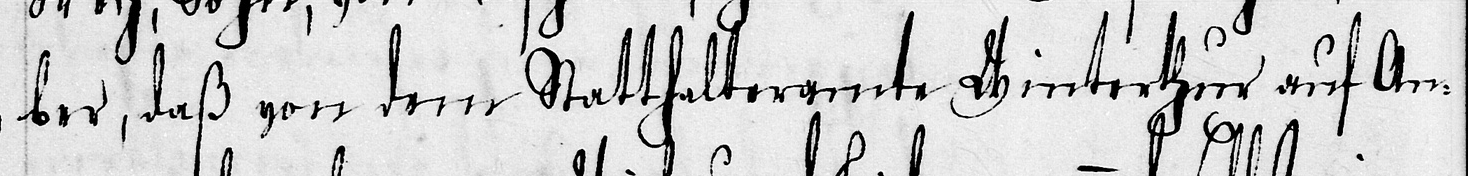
ber, daß von dem Statthalteramte Winterthur auf An¬
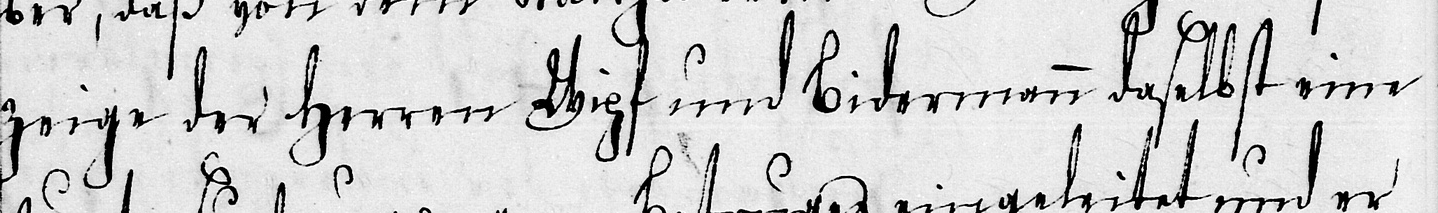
zeige der Herren Wipf und Bidermann daselbst eine
